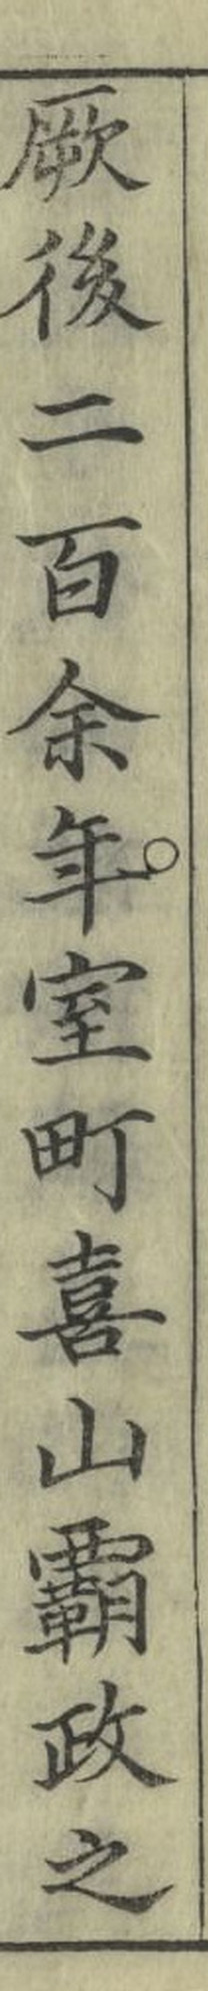厥後二百余年。室町喜山覇政之
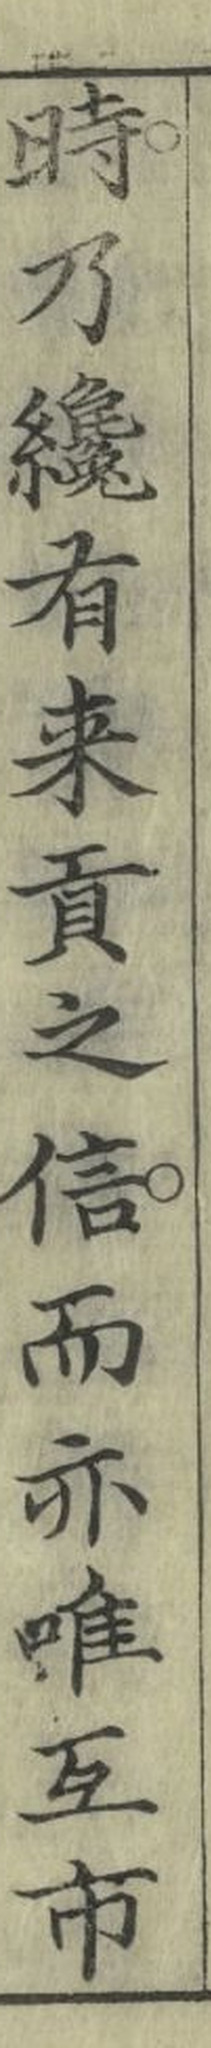時。乃纔有来貢之信。而亦唯互市
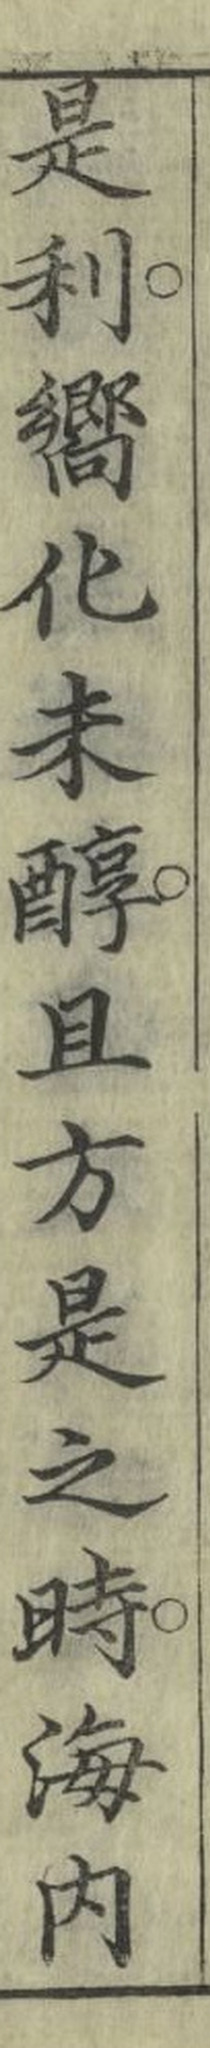是利。嚮化未醇。且方是之時。海内
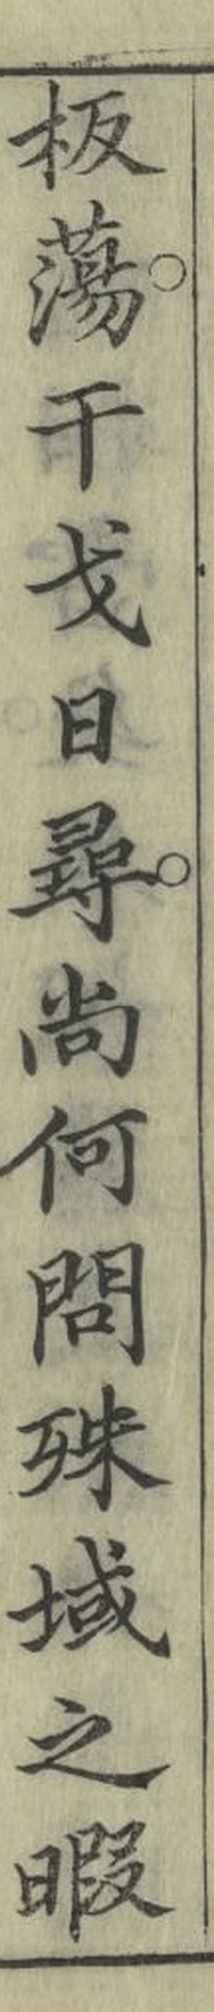板蕩。干戈日尋。尚何問殊域之暇
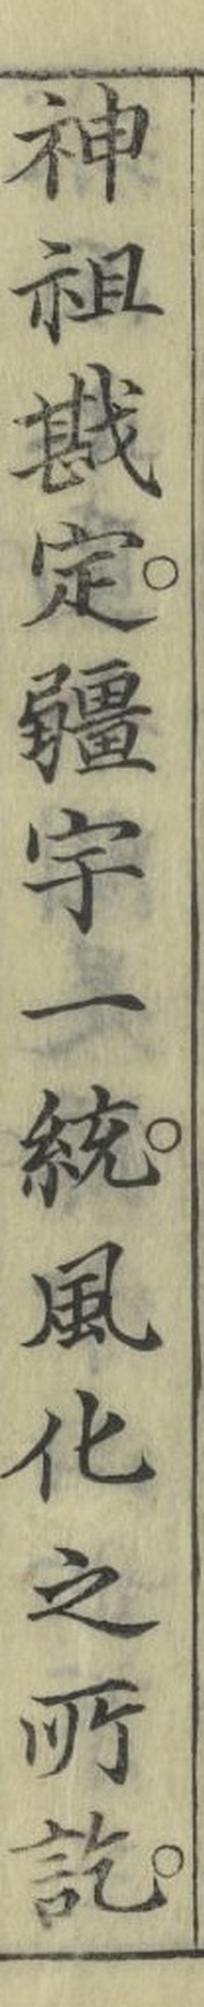神祖戡定。疆宇一統。風化之所訖。
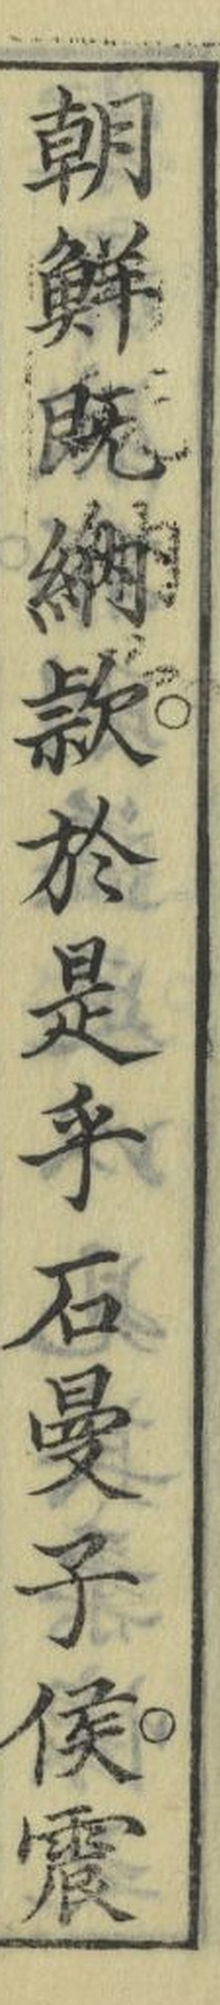朝鮮既納款。於是乎石曼子侯。震
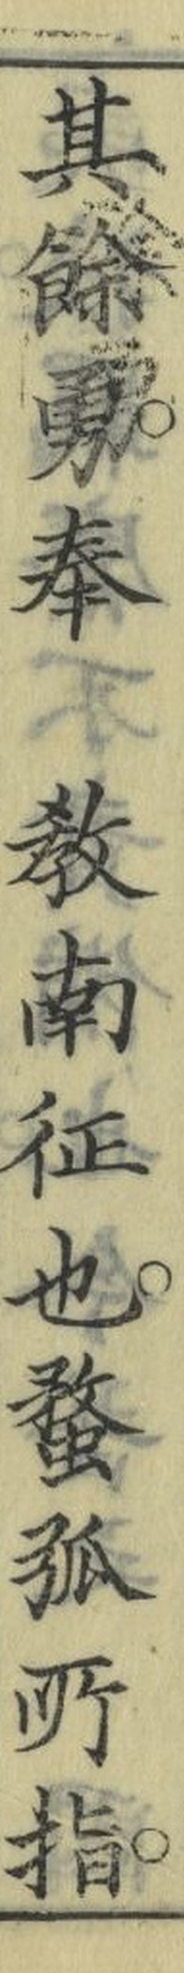其餘勇。奉敎南征也。蝥弧所指。
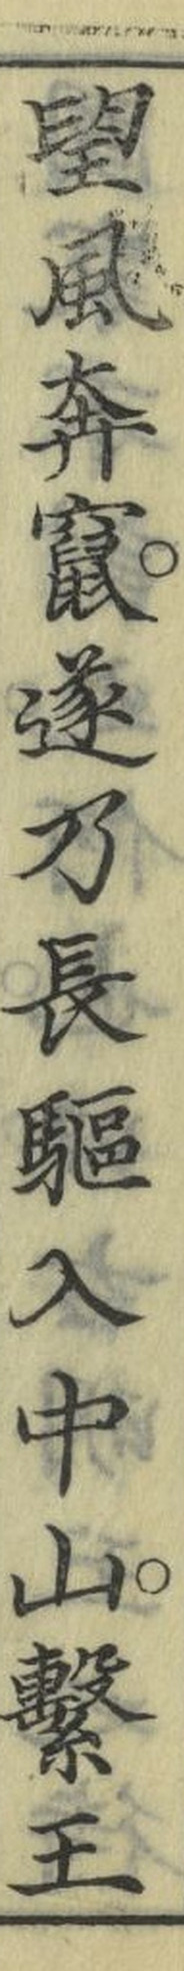望風奔竄。遂乃長驅入中山。繫王
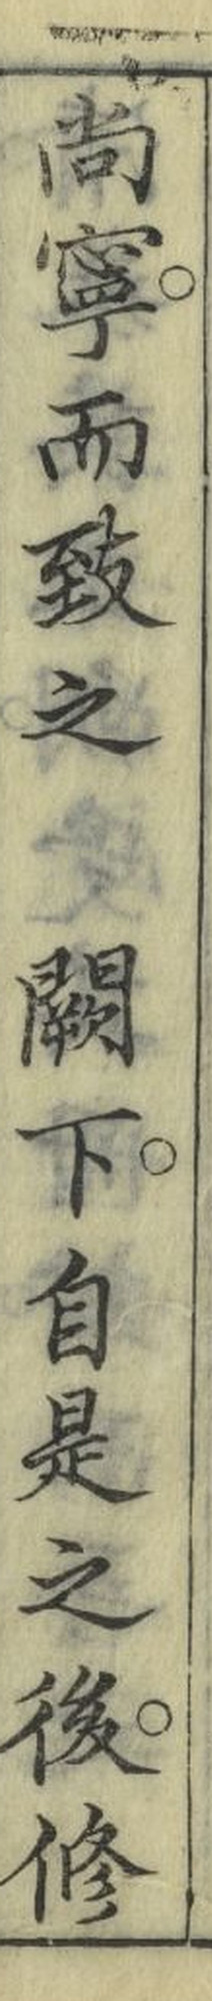尚寧。而致之闕下。自是之後。修
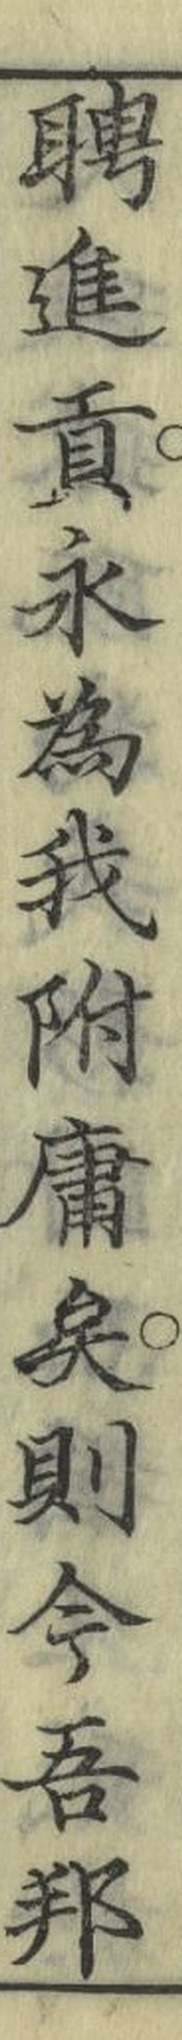聘進貢。永為我附庸矣。則今吾邦
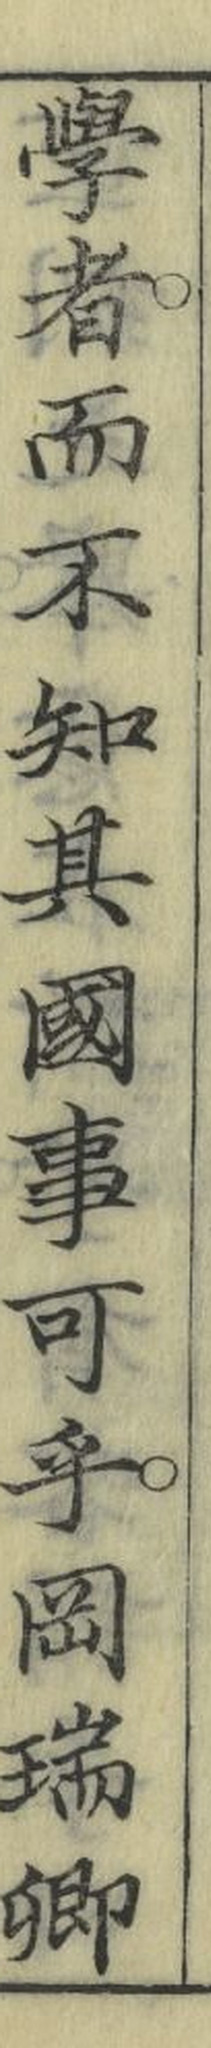學者。而不知其國事可乎。岡瑞卿

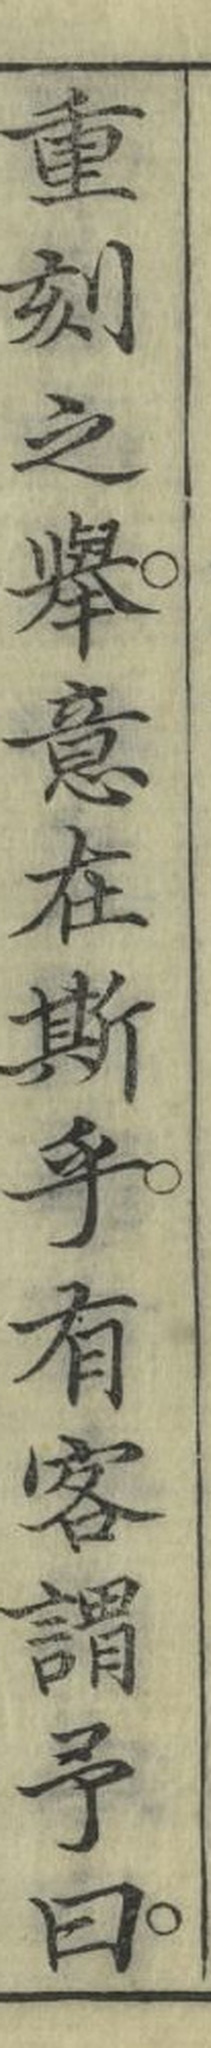重刻之舉。意在斯乎。有客謂予曰。
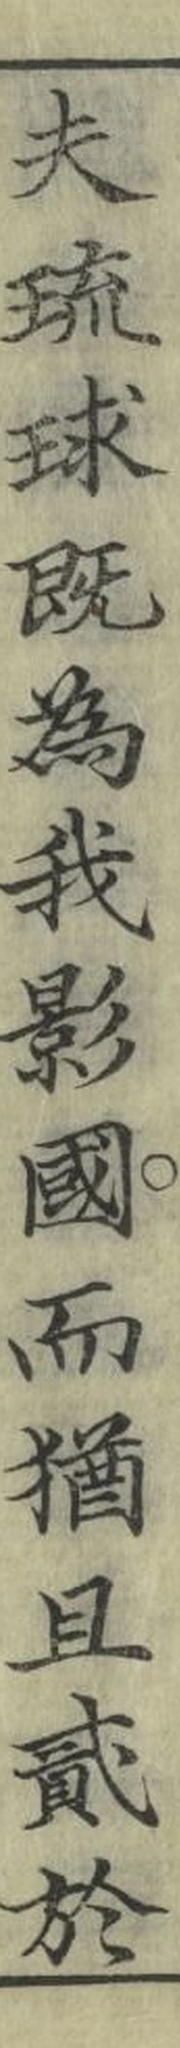夫琉球既為我影國。而猶且貳於
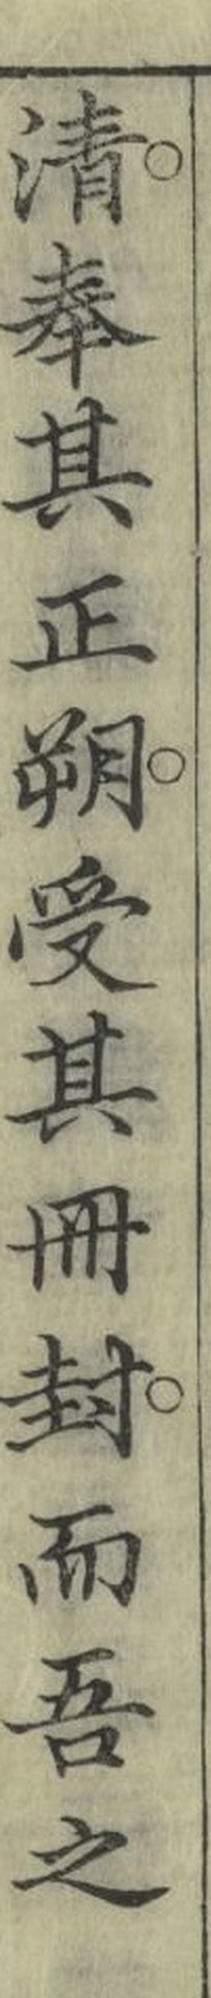清。奉其正朔。受其冊封。而吾之
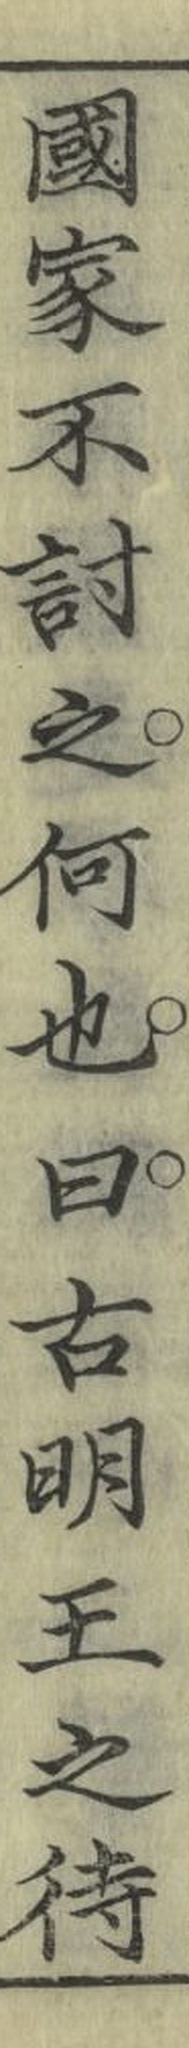國家不討之。何也。曰。古明王之待
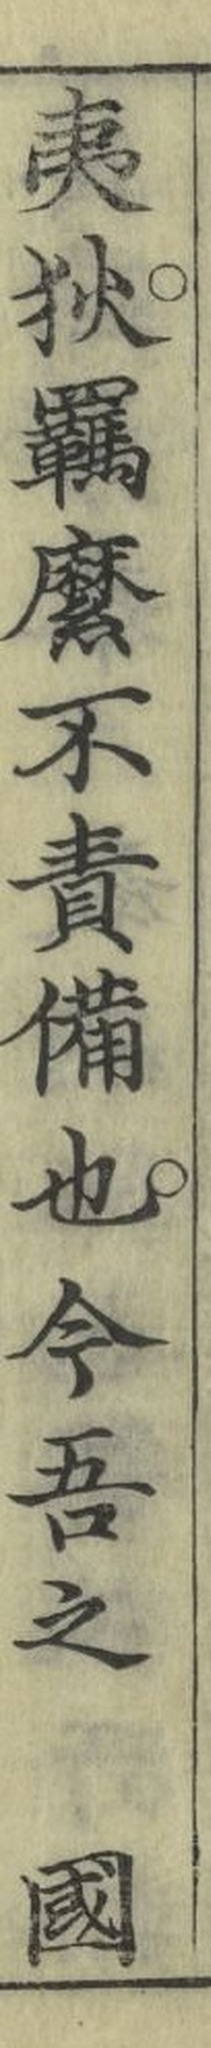夷狄。羈縻不責備也。今吾之國
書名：中山伝信録 巻一
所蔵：University of the Ryukyus Library
